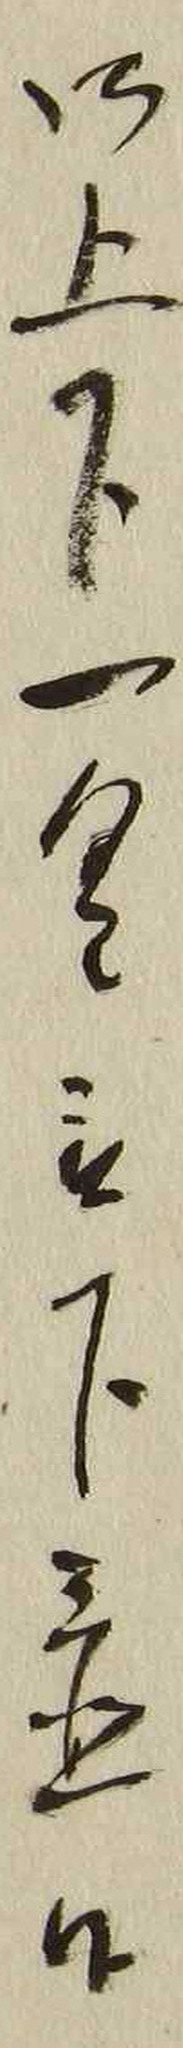御上下一具被下置候
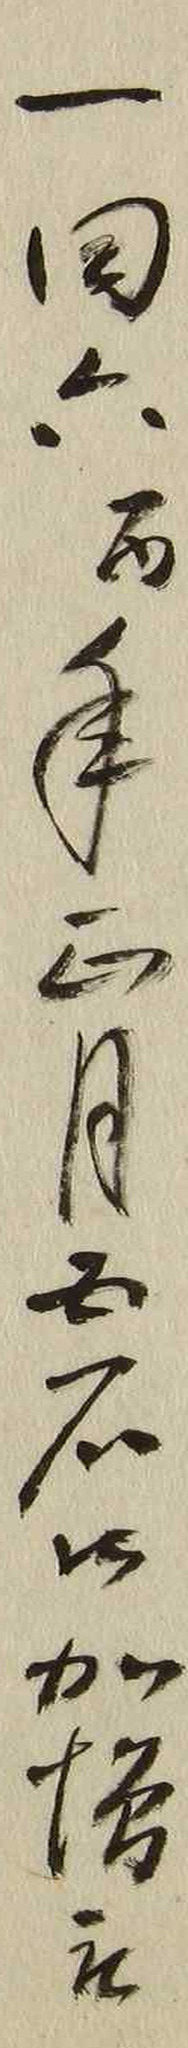一同六酉年正月五石御加増被
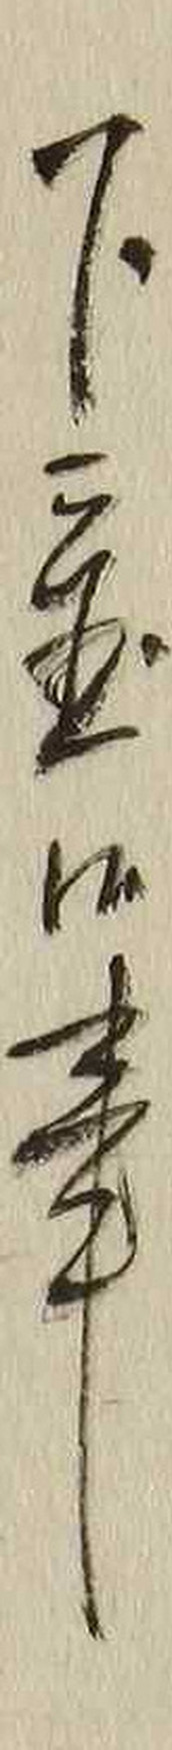下置候事
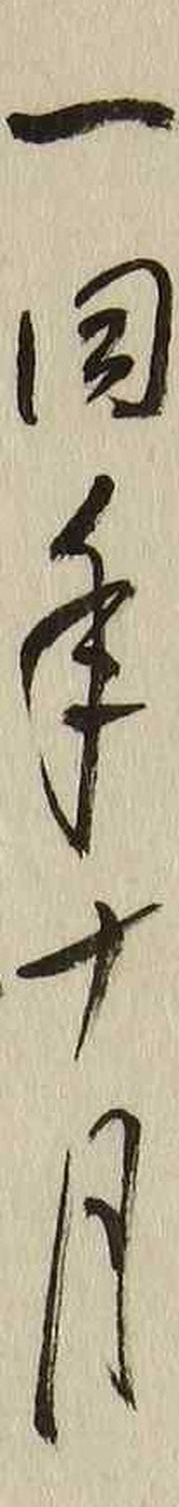一同年十月
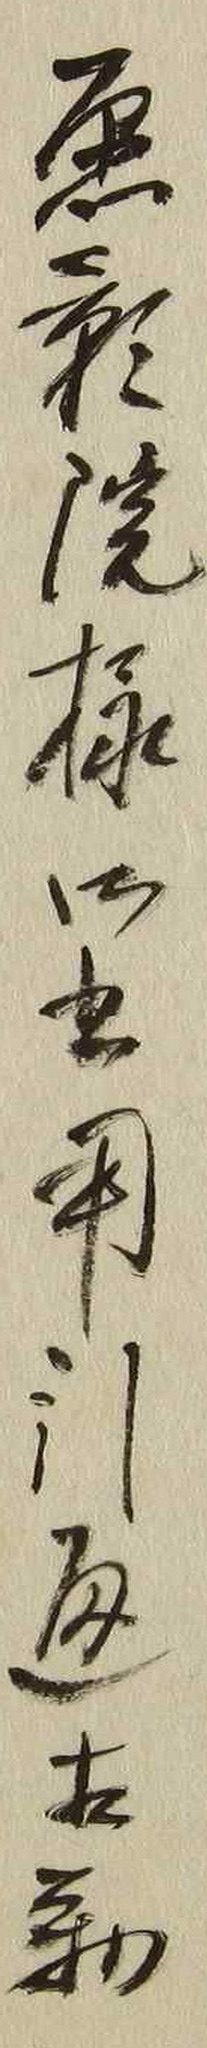愿彰院様御書用引通相勤
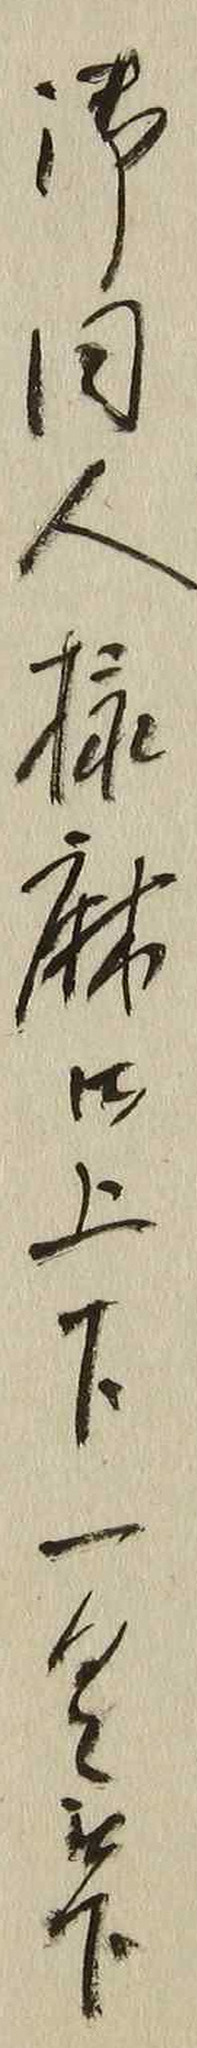御同人様麻御上下一具被下
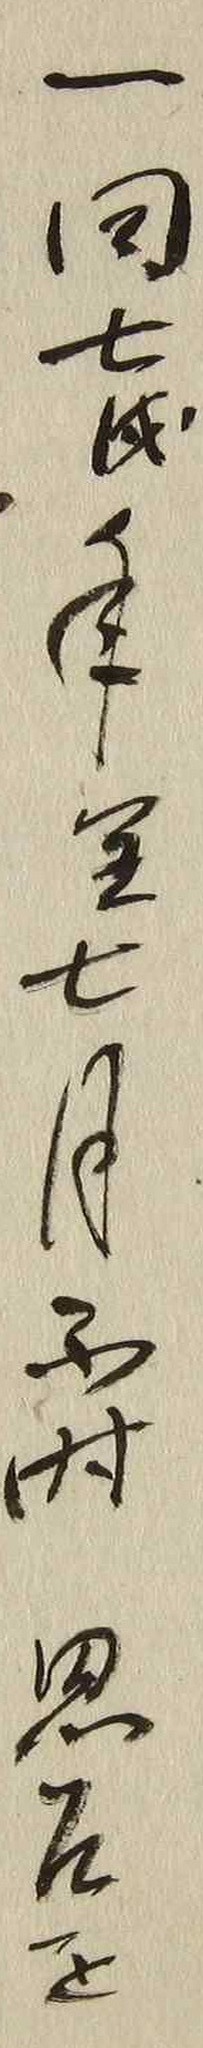一同七戌年閏七月不時思召を
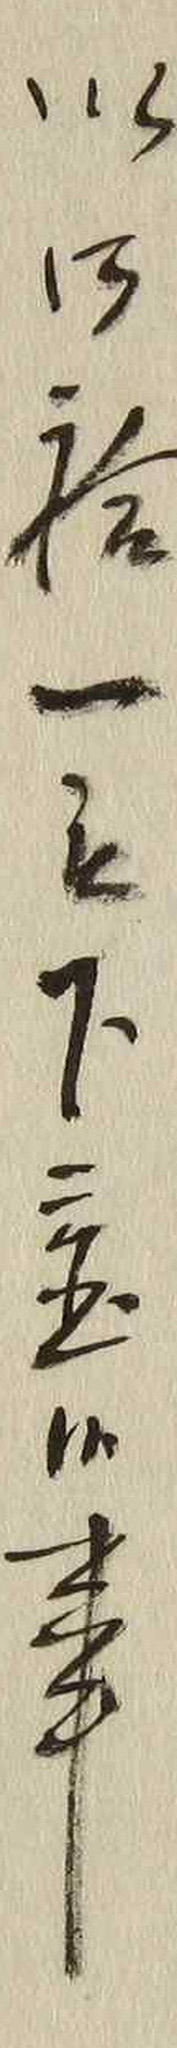以御袷一被下置候事
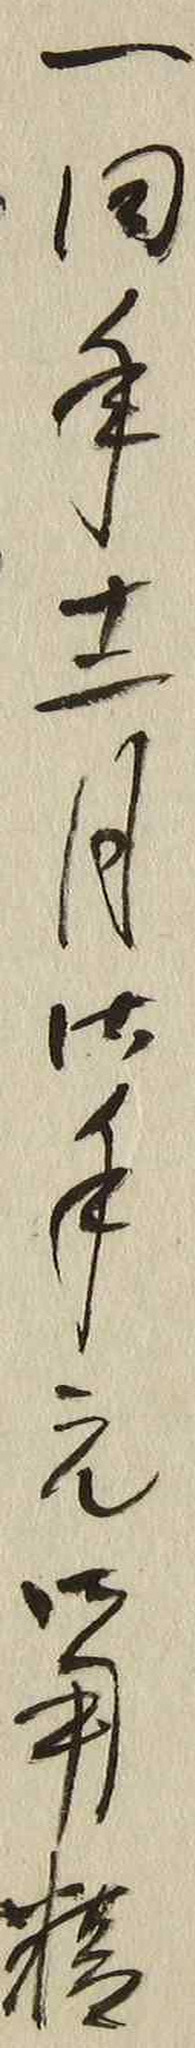一同年十二月御手元御用精
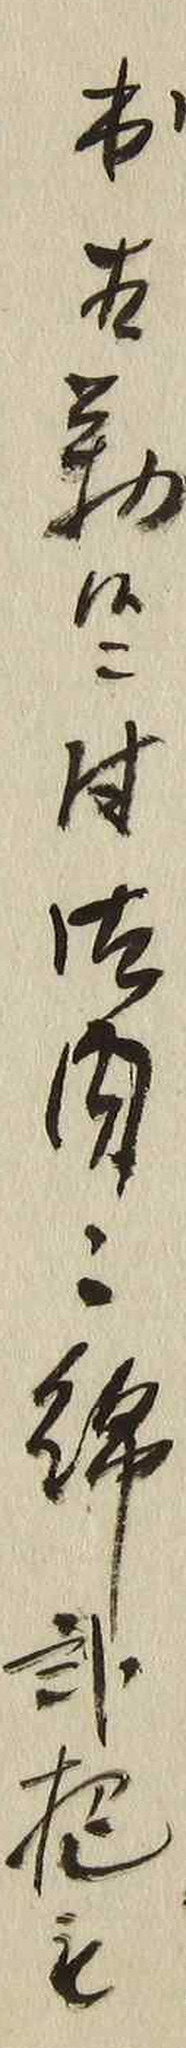出相勤候ニ付御内々綿弐把被
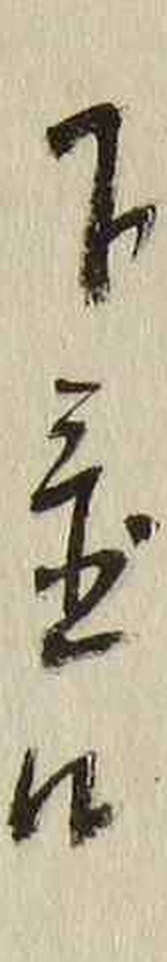下置候
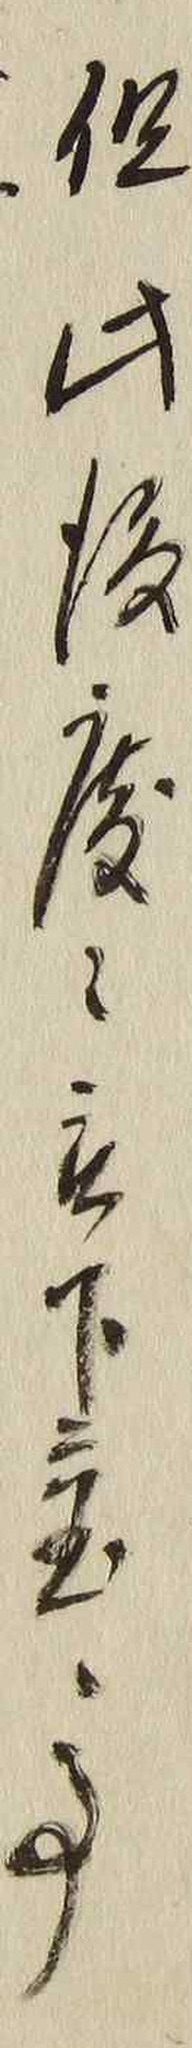但此後度々被下置候事
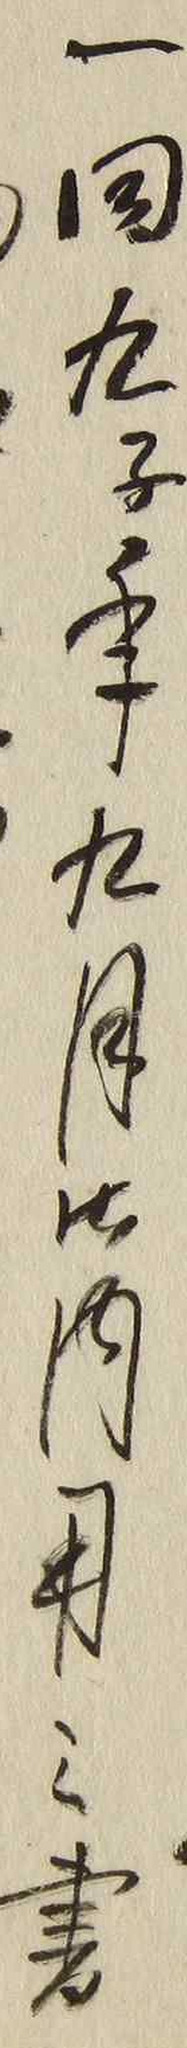一同九子年九月御内用之書
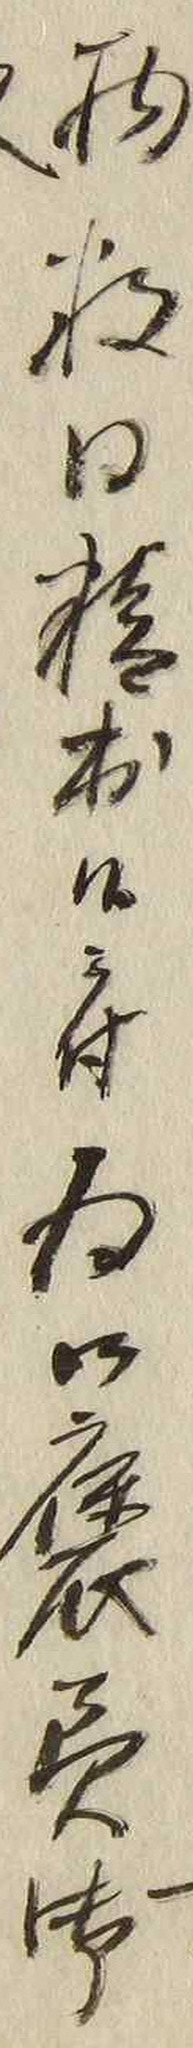物数日精出候ニ付為御褒美御
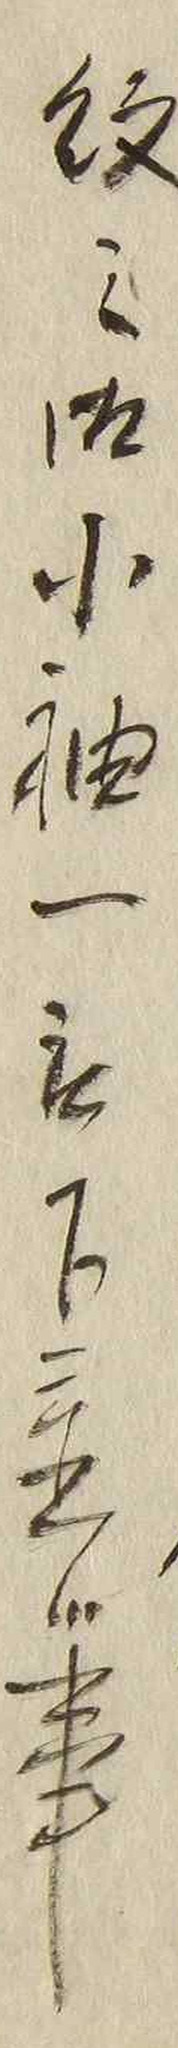紋之御小袖一被下置候事

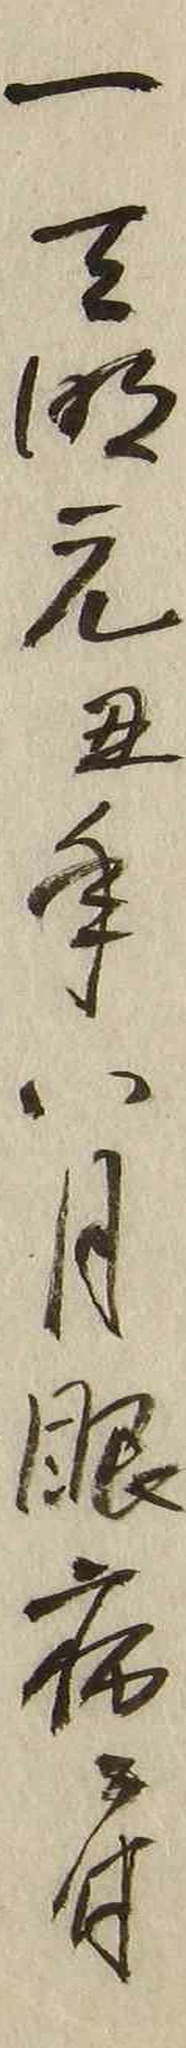一天明元丑年八月眼病ニ付
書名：諸士系譜　巻之359　す之部9
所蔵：会津若松市立会津図書館
